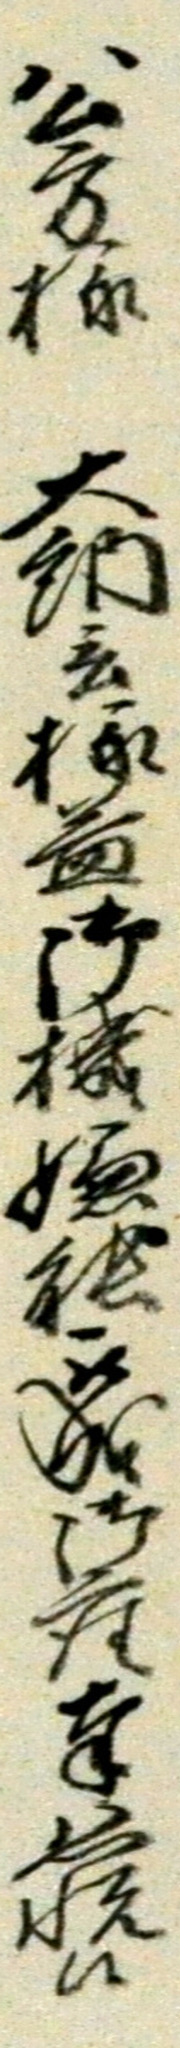公方様大納言様益御機嫌能被成御座奉恐悦候
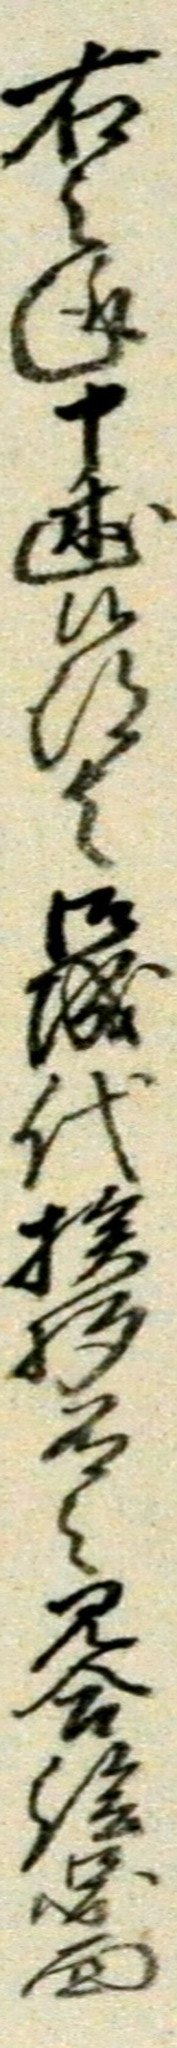右之趣申述候得は御城代挨拶有之見合絵図面
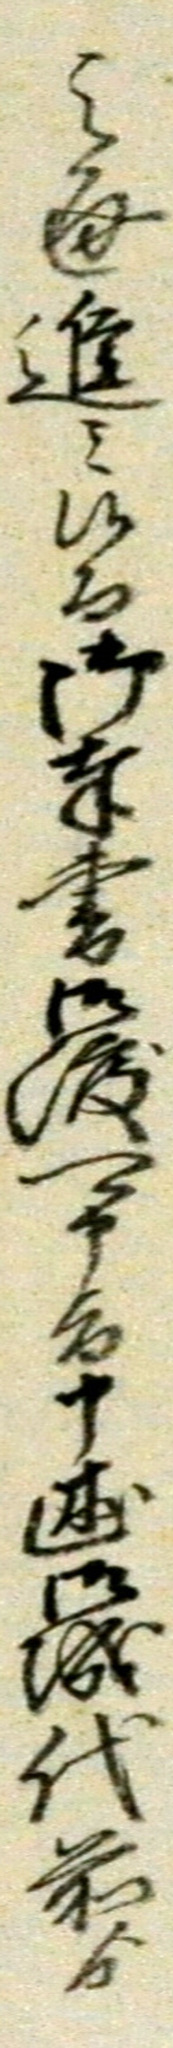之通進ミ候而御奉書御渡可申旨申述御城代前ゟ
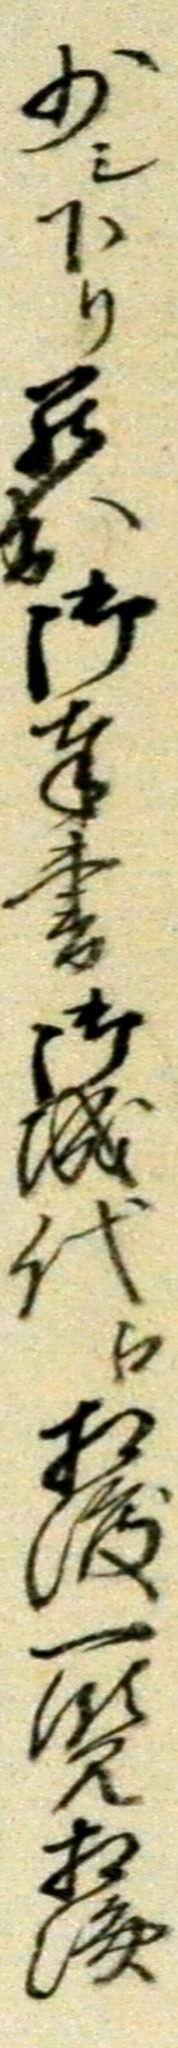少シ下り罷出御奉書御城代え相渡一覧相済
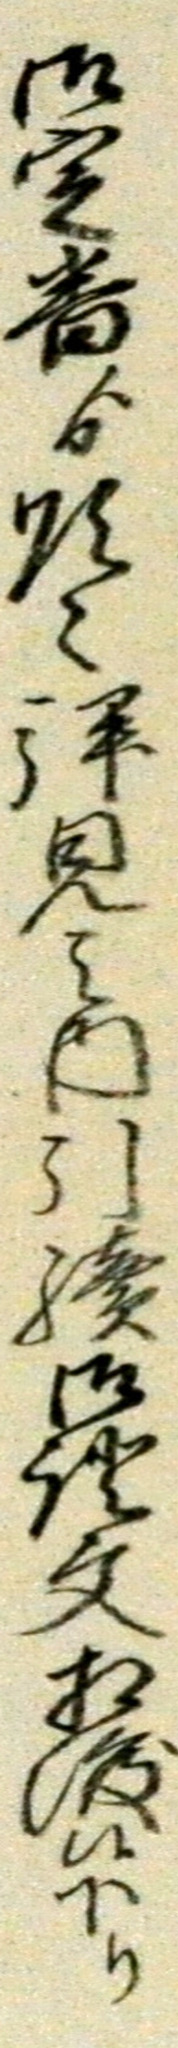御定番ゟ順々拝見之内引續御證文相渡候下り
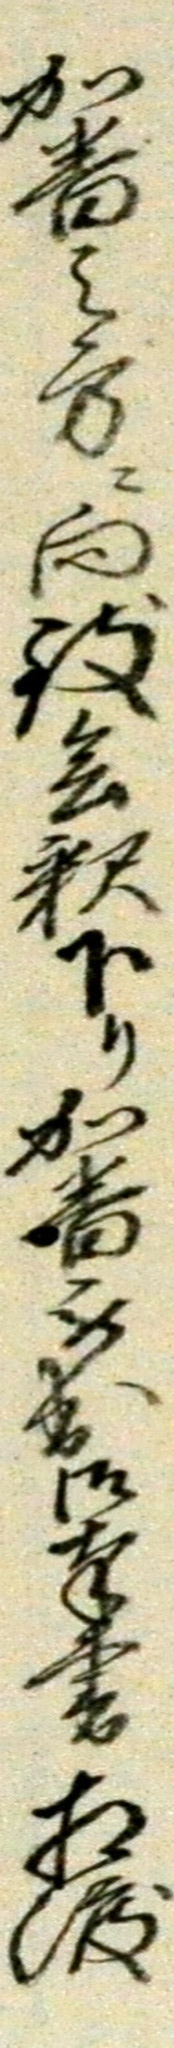加番之方ニ向致会釈下り加番被出御奉書相渡
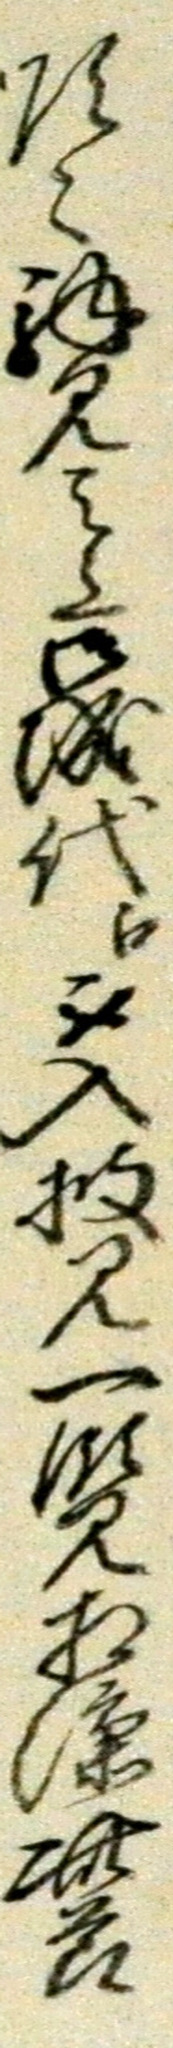順々拝見之上御城代え被入披見一覧相済此節
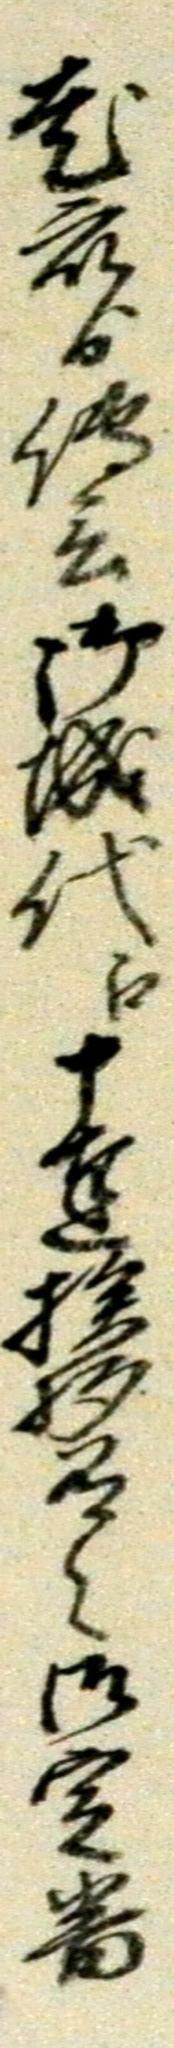老衆ゟ伝言御城代え申達挨拶有之御定番
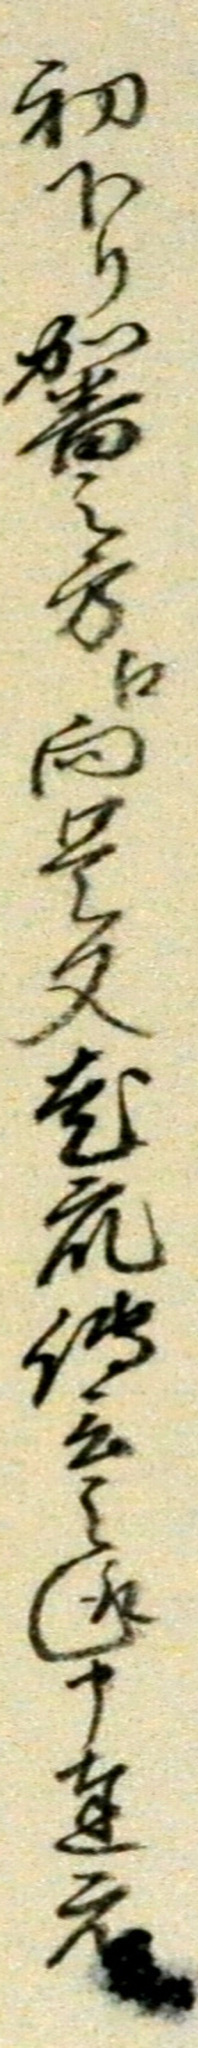初下り加番之方え向是又老衆伝言之趣申達元
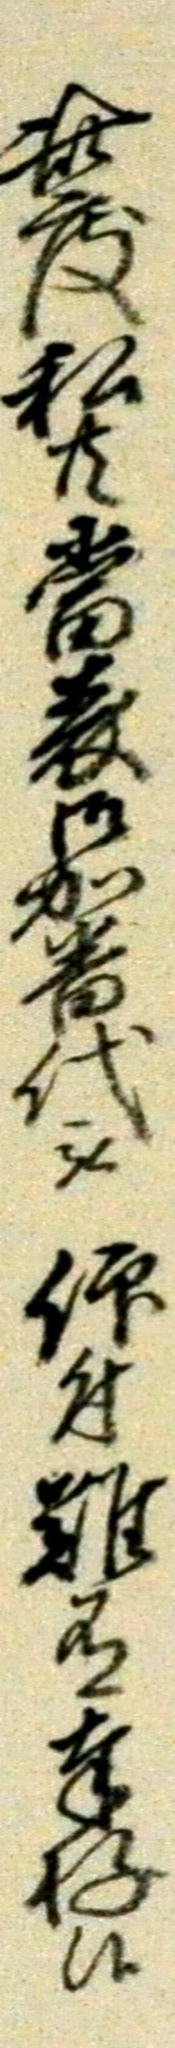此度私共当表御加番代被仰付難有奉存候
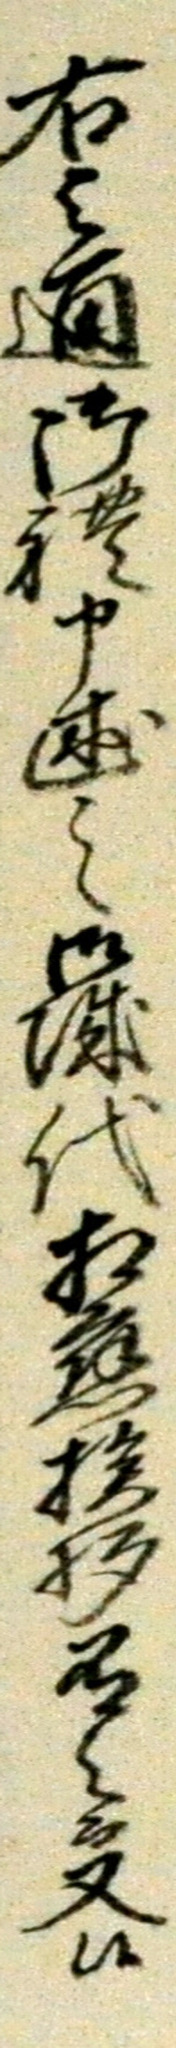右之通御礼申述候御城代相応挨拶有之而又候
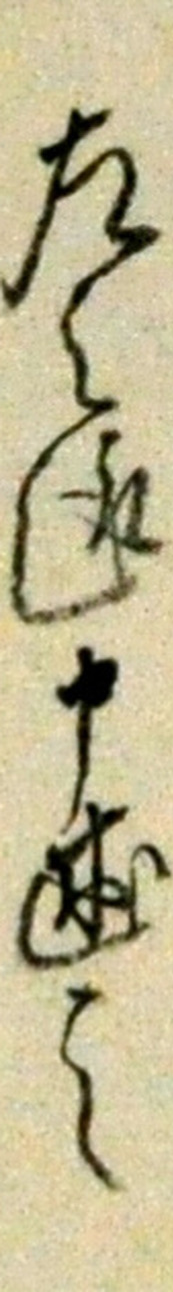左之趣申述候
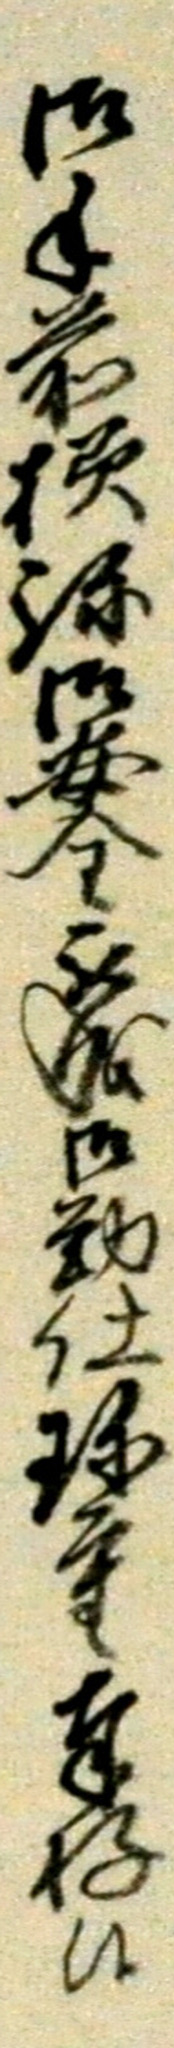御手前様弥御安全被成御勤仕珍重奉存候
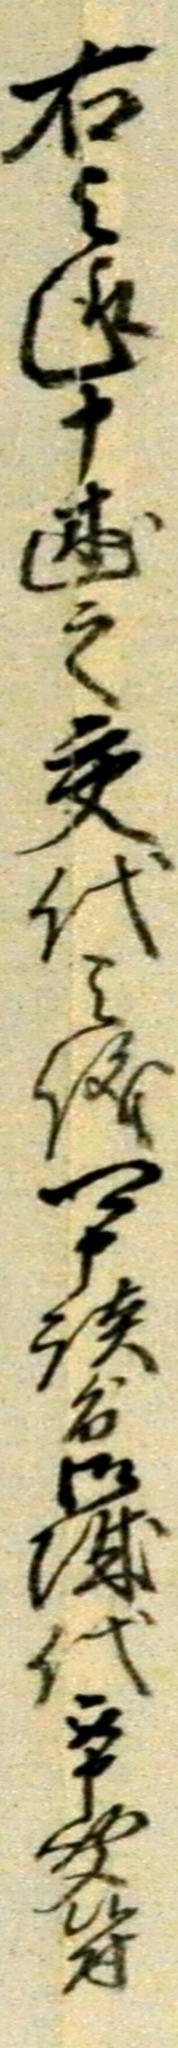右之趣申述之交代之儀可申談旨御城代被申聞候付
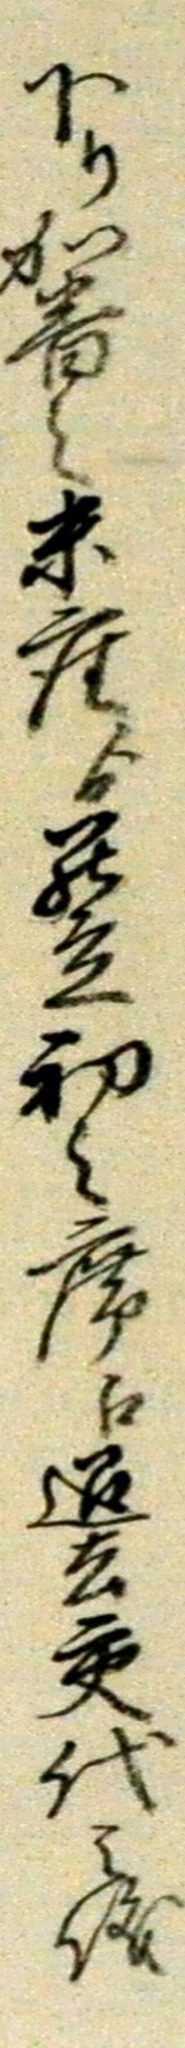下り加番之末座ゟ罷立初之席え退去交代之儀
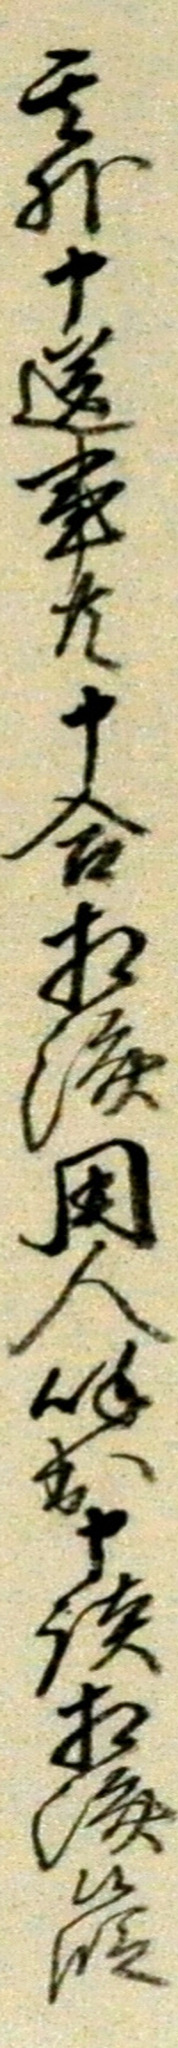其外申送事共申合相済用人呼出申談相済候段
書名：大阪加番関係諸書留〔一括〕
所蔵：伊那市立高遠町図書館・合同会社AMANE
